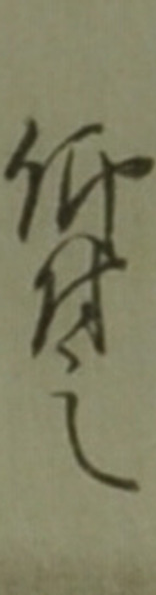仰付之
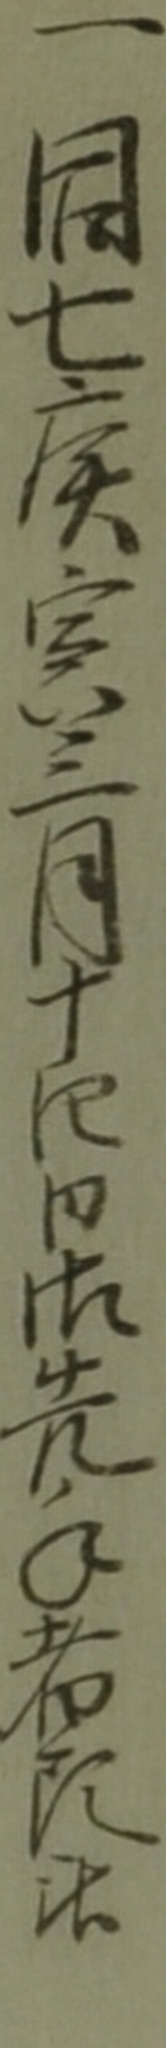一同七庚寅三月十四日御先手者頭被
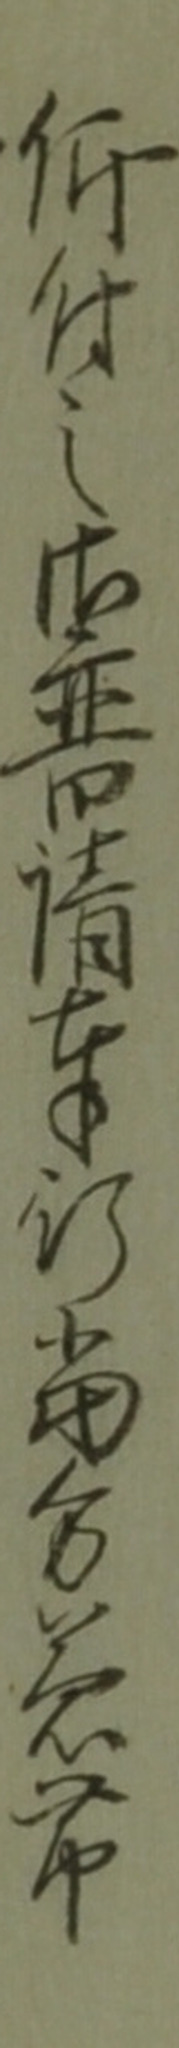仰付之御普請奉行当分兼帯
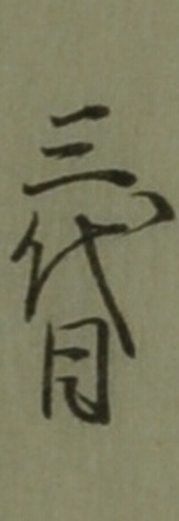三代目
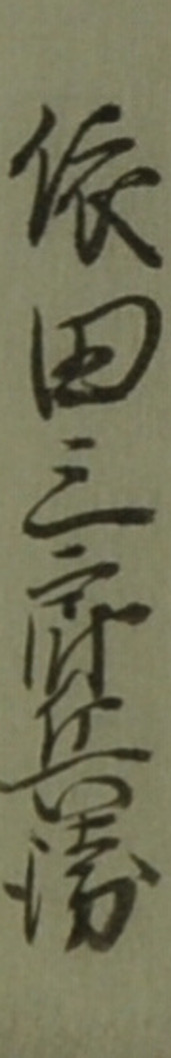依田三郎兵衛
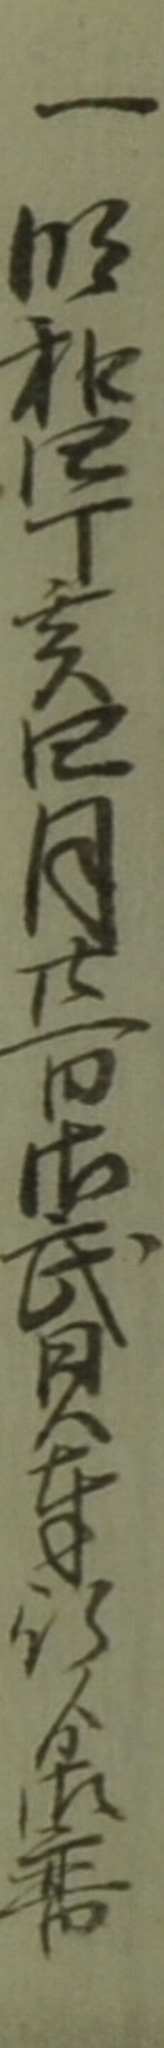一明和四丁亥四月廿一日御武具奉行ゟ御普
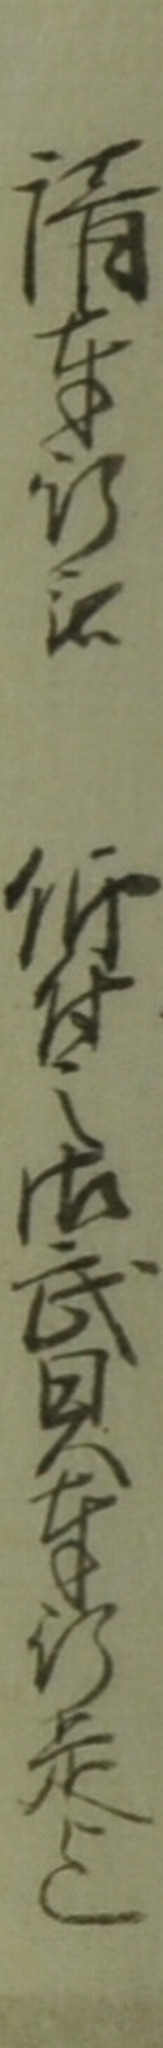請奉行被仰付之御武具奉行是迄

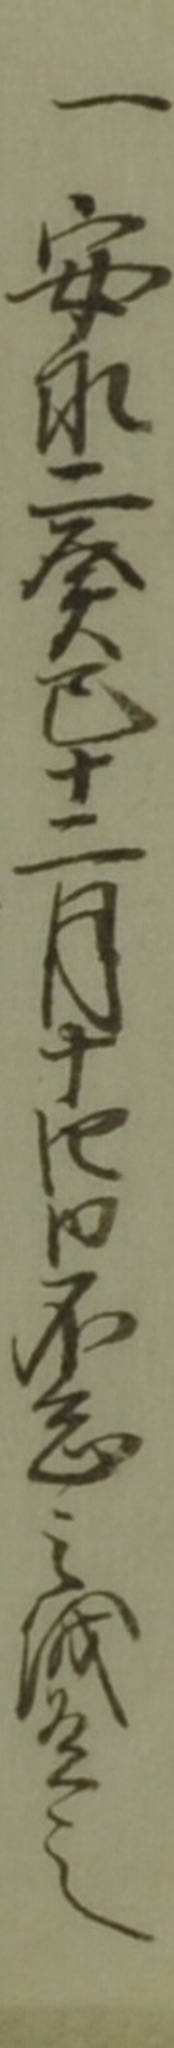一安永二癸巳十二月十四日不念之儀有之
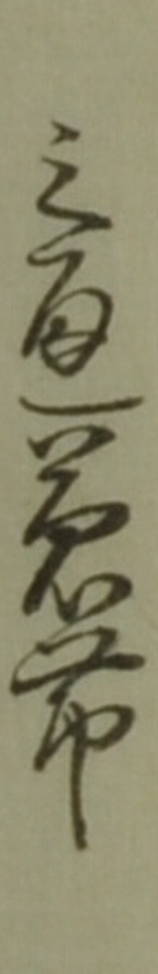之通兼帯
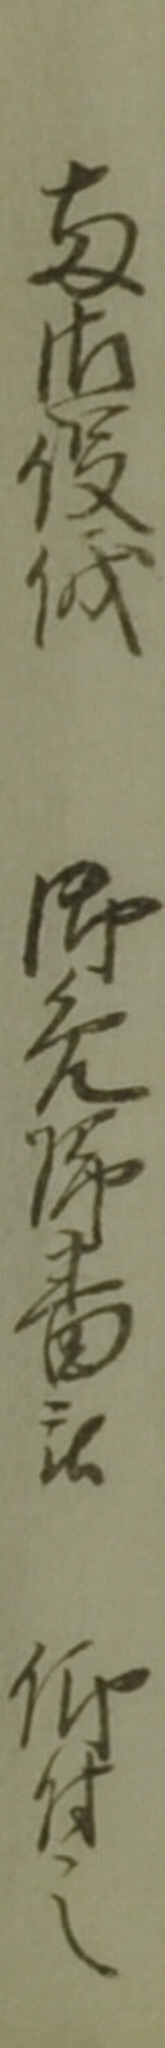両御役儀御免帰番被仰付之
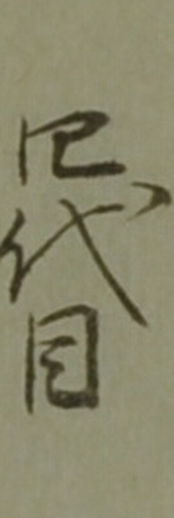四代目
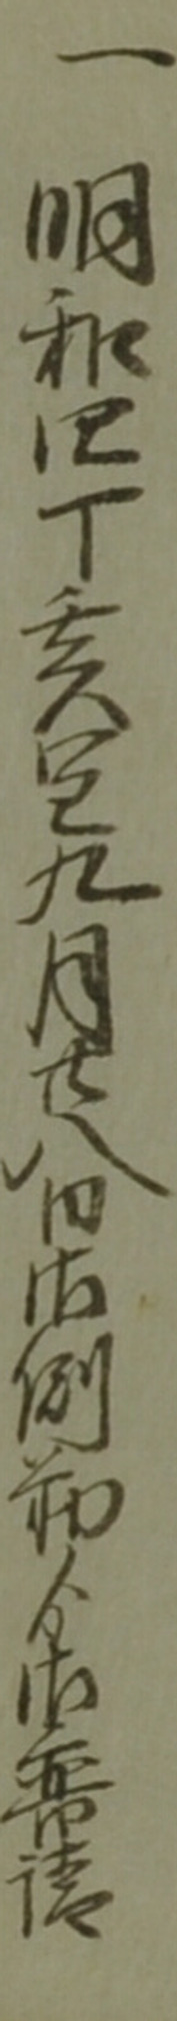一明和四丁亥閏九月廿八日御側勤ゟ御普請
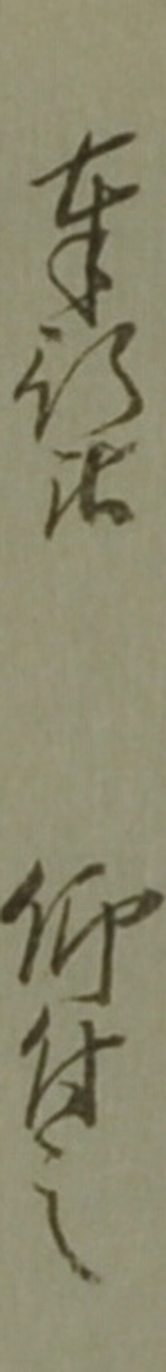奉行被仰付之
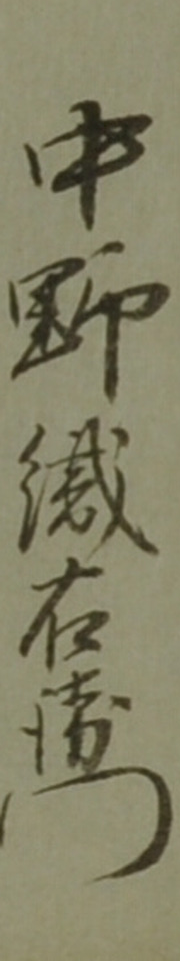中野織右衛門
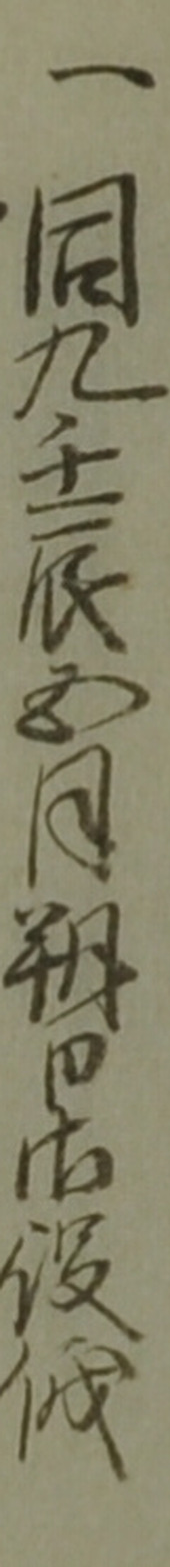一同九壬辰五月朔日御役儀
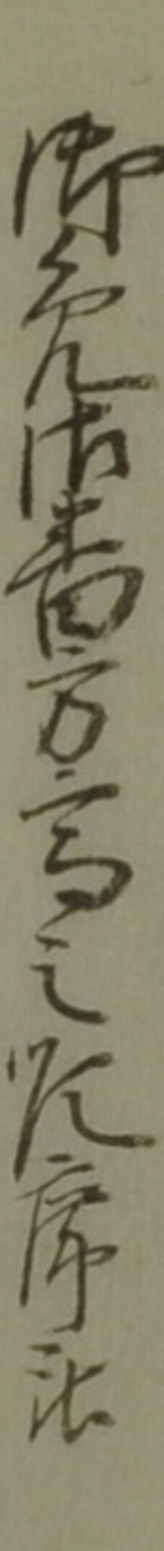御免御番方高之順席被
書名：諸御役代々録（六）
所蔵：伊那市立高遠町図書館・合同会社AMANE
